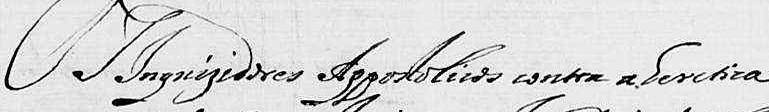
OS Inquizidores Appostolicos contra a heretica
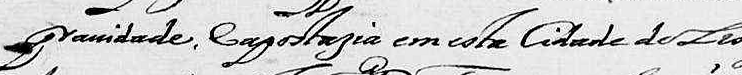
prauidade, e apostazia em esta Cidade de Lis
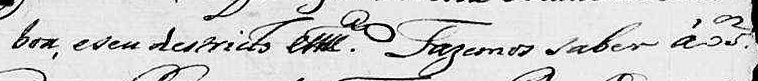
boa, e seu destricto etttc.a Fazemos saber áo s.or
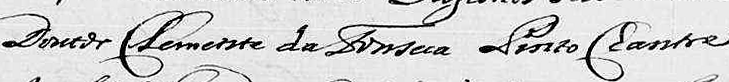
Doutor Clemente da Fonseca Pinto Chantre
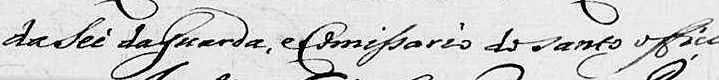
da Seè da Guarda, e Comissario do santo officio,
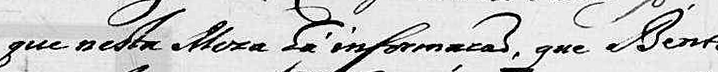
que nesta Meza há informaçaõ, que Bento
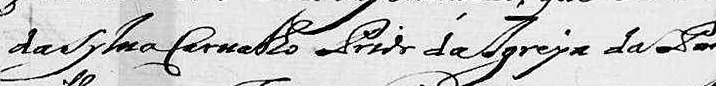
da Sylua Carualho Prior da Igreya da Pam
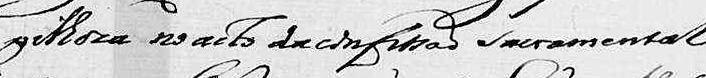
pilhoza no acto da confissaõ sacramental
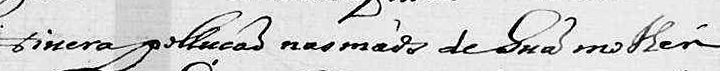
tiuera polluçaõ nas mãos de huā molher
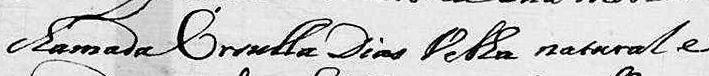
chamada Ursulla Dias Velha natural e
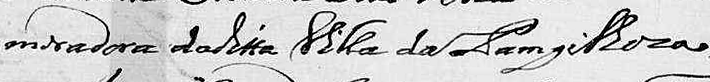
moradora da ditta Villa da Pampilhoza,
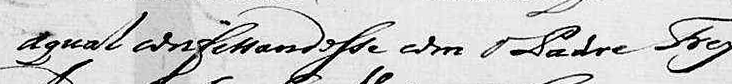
a qual confessandosse com o Padre Frey
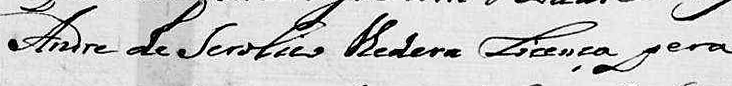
Andre de Serolico lhe dera Licença pera
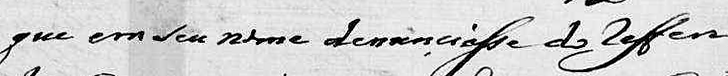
que em seu nome denunciasse do Refferi
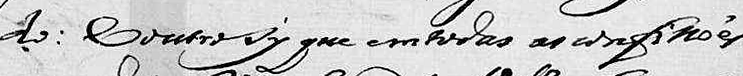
do: E outrosy que em todas as confissoẽs
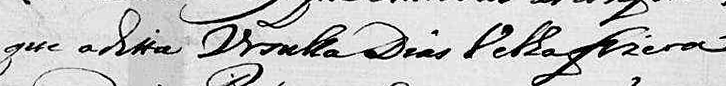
que a ditta Vrsulla Dias Velha fizera
